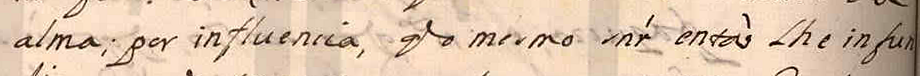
alma; por influencia, q̄ o mesmo snr̄ então lhe infun
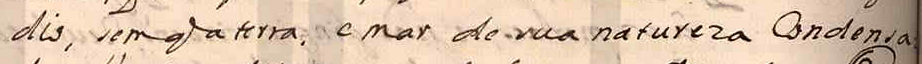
dio, sem q̄ a terra, e mar de sua natureza condensa
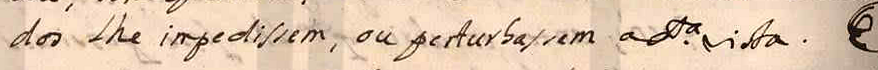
dos lhe impedissem, ou perturbassem a d̄.a vista. E
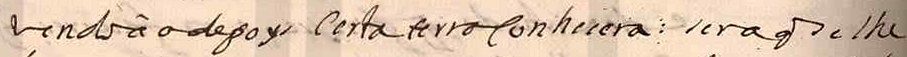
vendo âo depoys certa terra conhecera: ser a q̄ se lhe
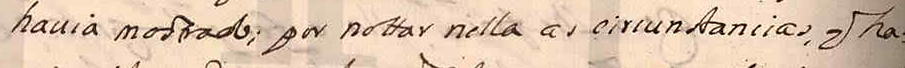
hauia mostrado; por nottar nella as circunstancias, q̄ ha
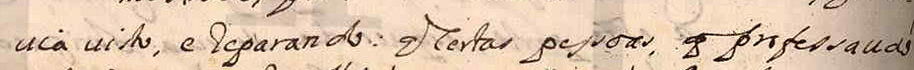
uia uisto, e Reparando q̄ certas pessoas, q̄ professauaõ
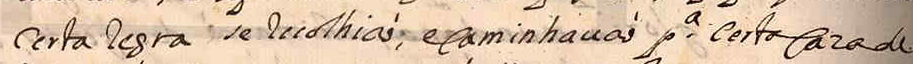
certa Regra, se Recolhiaõ, e Caminhauaõ p.a certa Caza de
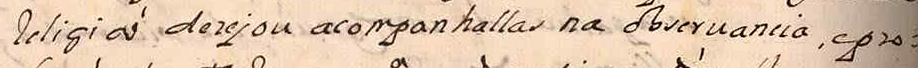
Religiaõ dezejou acompanhallas na obseruancia, e pro
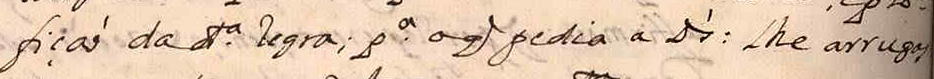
fiçaõ da d̄.a Regra, p.a o q̄ pedia a Ds̄ lhe arrugas
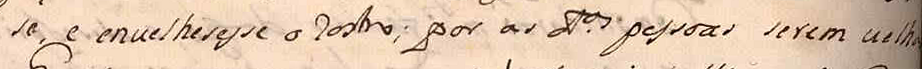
se, e enuelhesesse o Rostro; por as d̄.as pessoas serem uelha
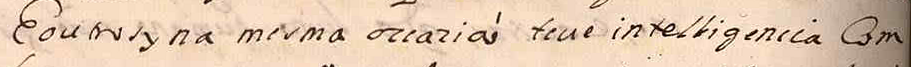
E outrosy na mesma occaziaõ teue intelligencia Com
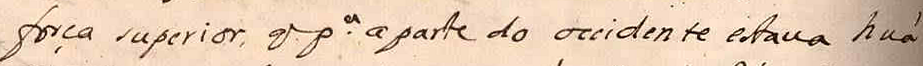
força superior, q̄ p.a a parte do occidente estaua huā
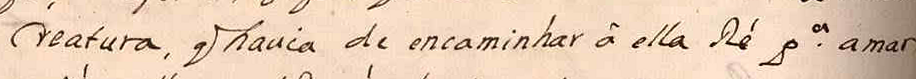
Creatura, q̄ hauia de encaminhar à ella Ré p.a amar
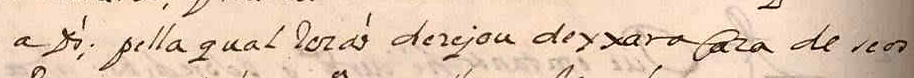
a Ds̄. pella qual Rezaõ dezejou deixar a Caza de seos
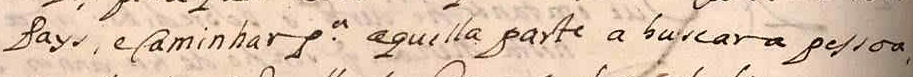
Pays, e Caminhar p.a aquella parte a buscar a pessoa
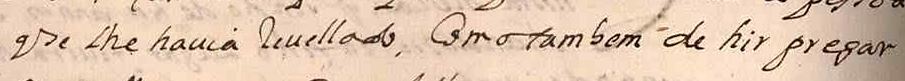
q̄ se lhe hauia Reuellado, Como tambem de hir pregar
